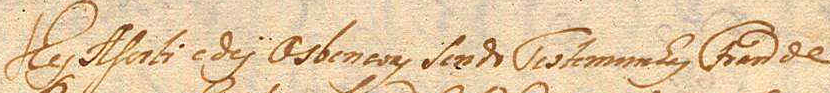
lhes Asesti e dej as bençoas sendo Testemunhas Fran̄ de
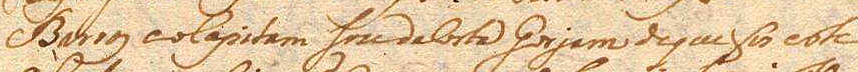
Barros e o Capitam Joze da Costa Gorjam de que fis este
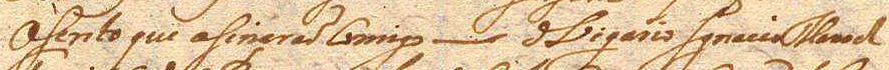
asento que asinaraõ Comigo - o Vigario Jgnacio Manoel
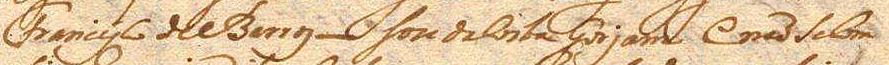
Francisco de Barros - Joze da Costa Gorjam E naõ se Com
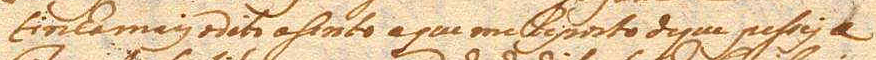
tinha mais o dito asento a que me Reporto de que passej a
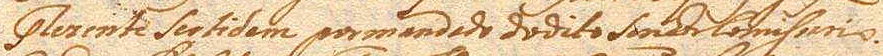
pRezente sertidam por mandado do dito Senhor Comissario.
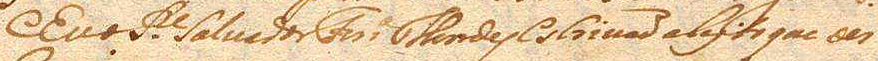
e Eu o P.e Saluador Ferra Mendes esCriuaõ elejto que o es
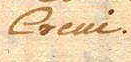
Creui.
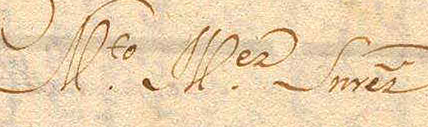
M.to Ill.ez Snrēs
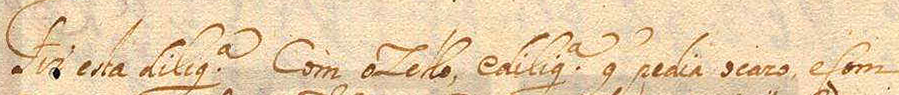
Fiz esta dilig.a Com o Zello, e dilig.a q̄ pedia o cazo, e Com
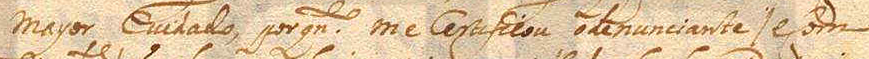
mayor Cuidado, porqn.to me Certeficou o denunciante / e Com
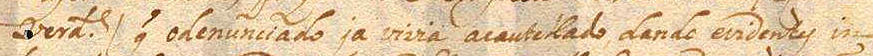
verd̄.e / q̄ o denunciado ja vivia acautellado dando evidentes in
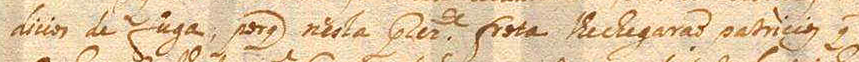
dicios de fuga, porq̄ nesta prez.te frota lhe chegaraõ patricios q̄
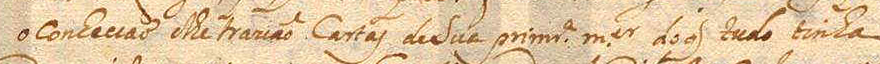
o conheciaõ e lhe traziaõ Cartas de Sua primr.a m.er do q̄ tudo tinha
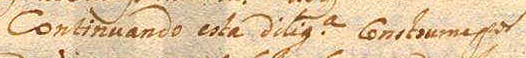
Continuando esta dilig.a constoume por
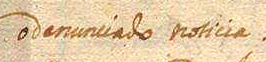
o denunciado noticia.
